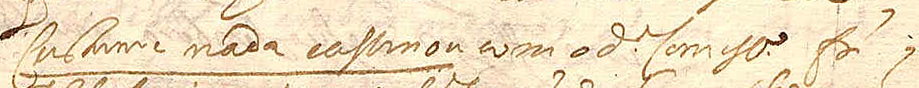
Custume nada e assinou com o d.o Comiss.o fr̄
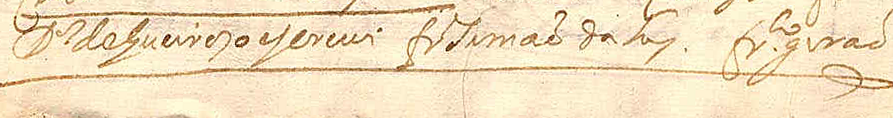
Dos de Queiroz o escreui fr̄ Simaõ da lus fr.co giraõ
